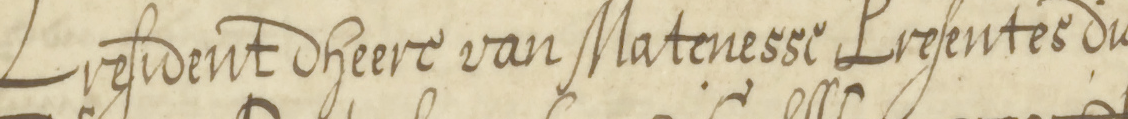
President dheere van Matenesse Presentes die
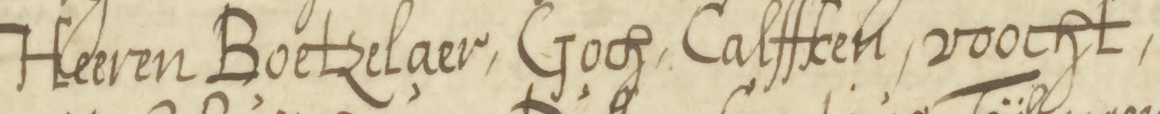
Heeren Boetzelaer, Goch, Calffken, voocht,
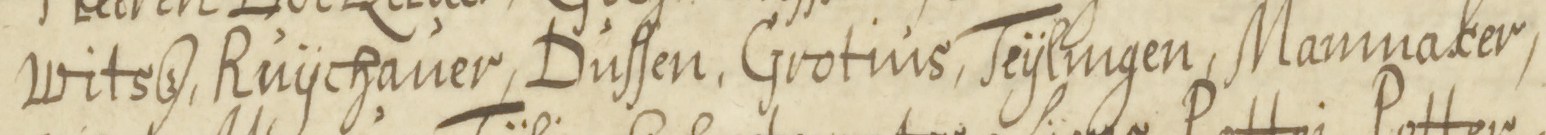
Witsz, Huijchauer, Dussen, Grotius, Teijlingen, Manmaker,
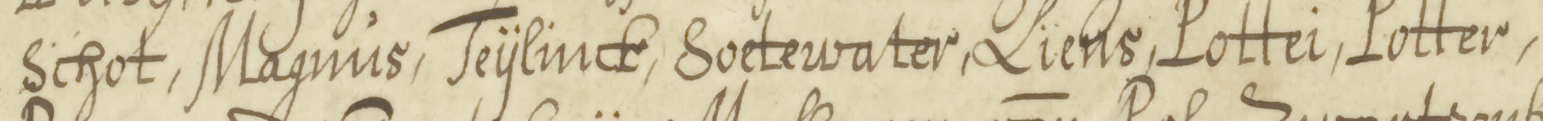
Schot, Magnus, Teijlinck, Soetewater, Liens, Pottei, Potter,
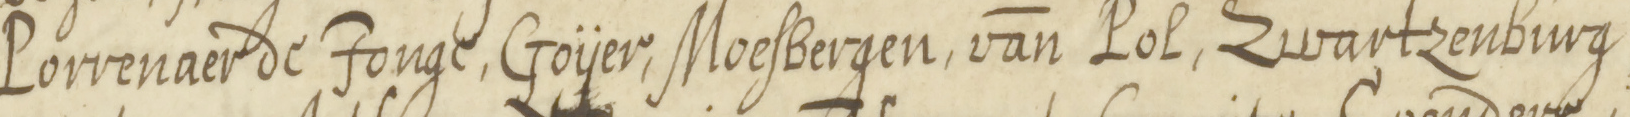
Porrenaer de Jonge, Goijer, Moesbergen, van Pol, Zwartzenburg,
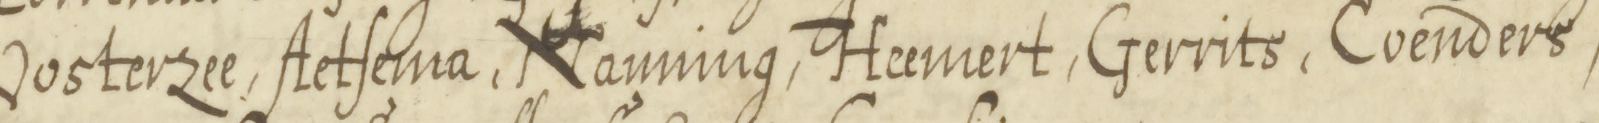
Oosterzee, Aetsema, Nanning, Heemert, Gerrits, Coenders,
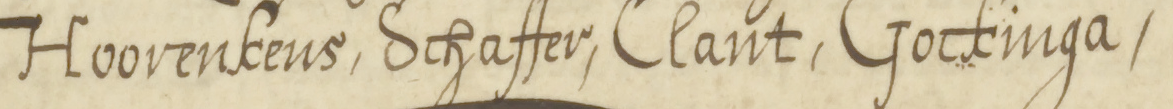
Hoorenkens, Schaffer, Clant, Gockinga,
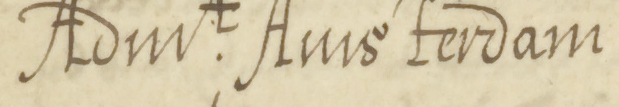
Admt. Amsterdam
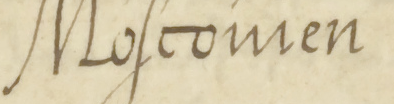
Moscouien
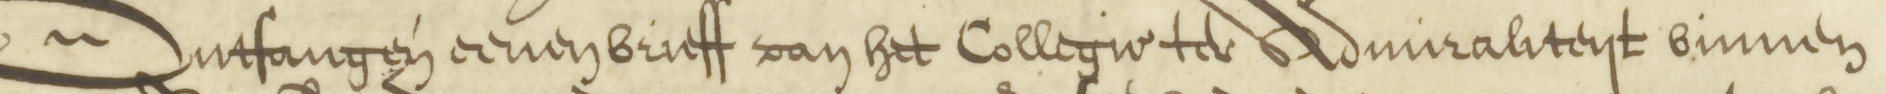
Ontfangen eenen briefff van het Collegie ter Admiraliteyt binnen
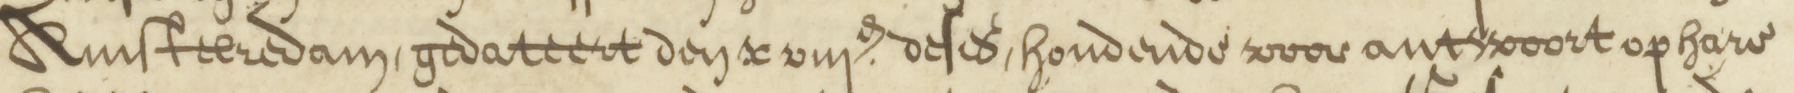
Amstelredam, gedateert den xviijen. deses, houdende voor antwoort op hare
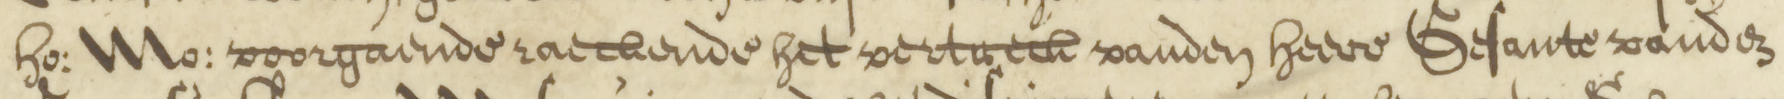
ho:Mo: voorgaende raeckende het vertreck vanden heere Gesante vanden
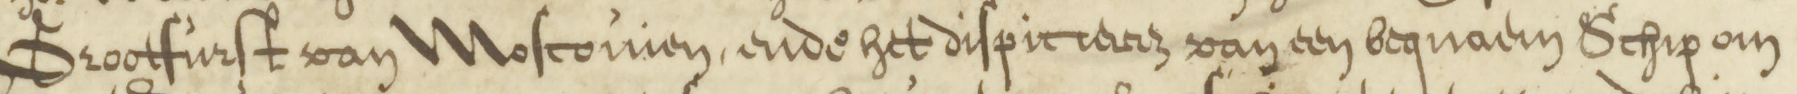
Grootfurst van Moscouien, ende het dispicieren van een bequaem Schip om
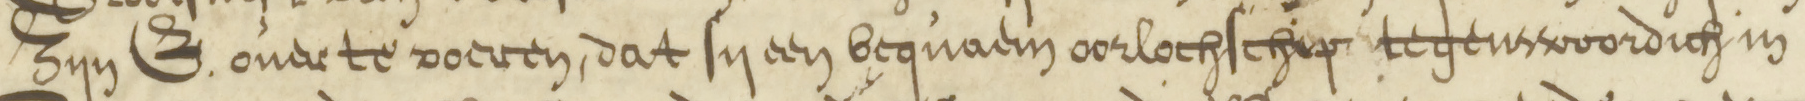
zyn E. ouer te voeren, dat sy een bequaem oorlochschip tegenwoordich in
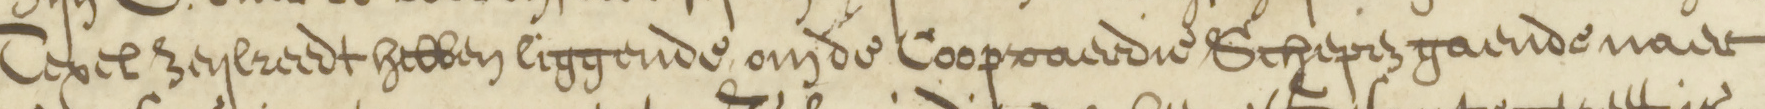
Texel zeylreedt hebben liggende, om de Coopvaerdie Schepen gaende naer
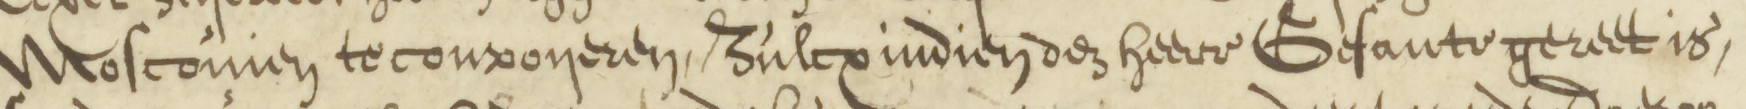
Moscouien te convoyeren, zulcx indien den heere Gesante gereet is,
